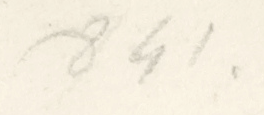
841.
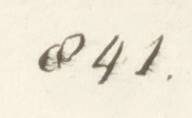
841
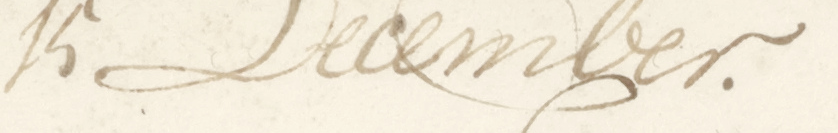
15 December.
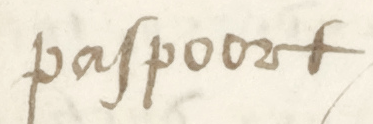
paspoort
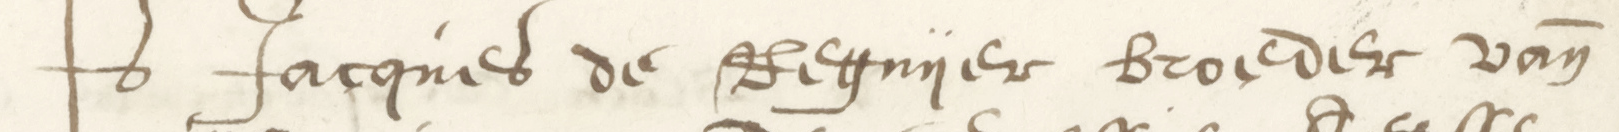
Is Jacques de Regnijer broeder van
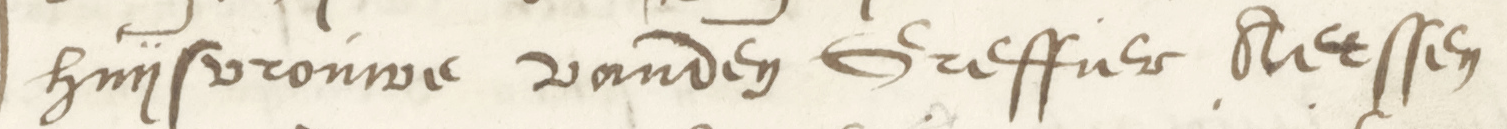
huijsvrouwe vanden Greffier Aerssen,
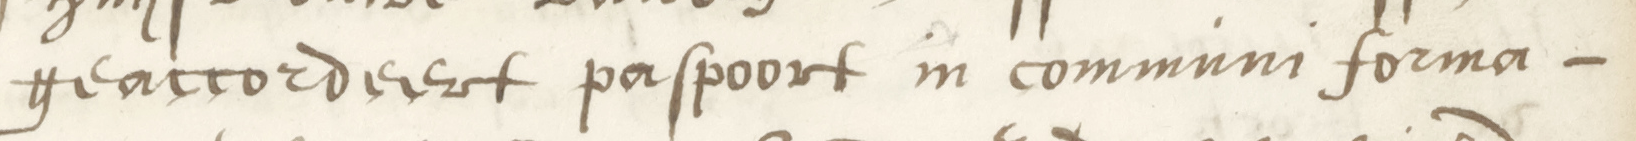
geaccordeert paspoort in communi forma
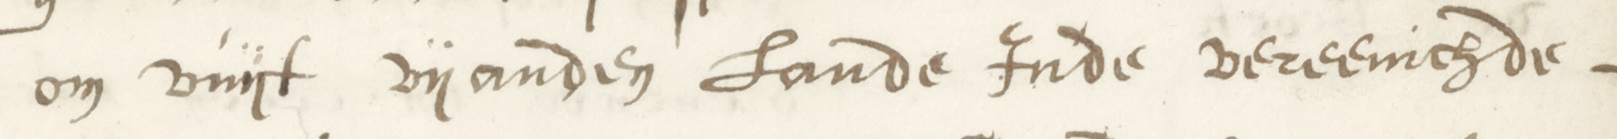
om vuijt vijanden Lande Inde vereenichde
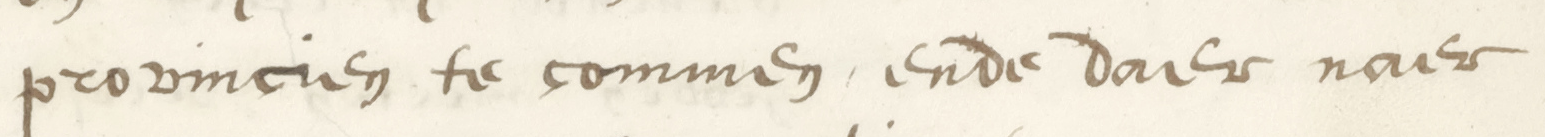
provincien te commen, ende daer naer
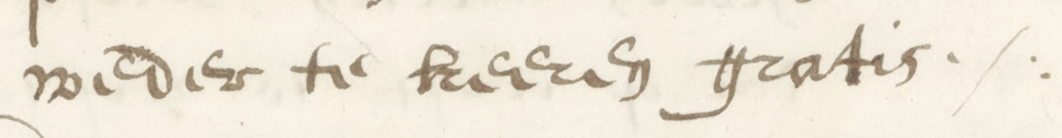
weder te keeren gratis.
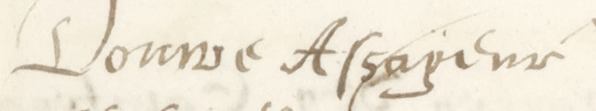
Douwe Assaijeur
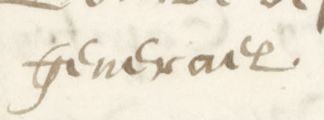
generael
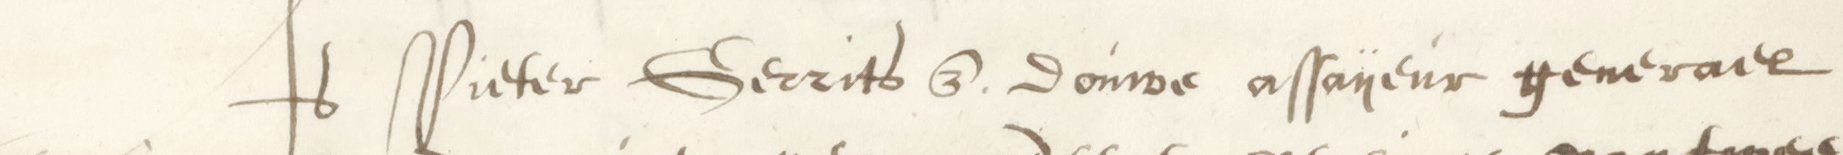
Is Pieter Gerritsz Douwe assaijeur generael
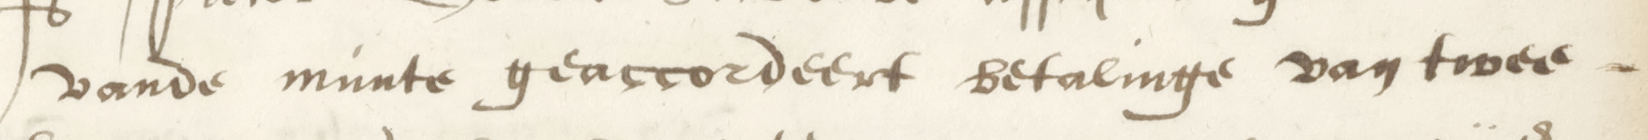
vande munte geaccordeert betalinge van twee
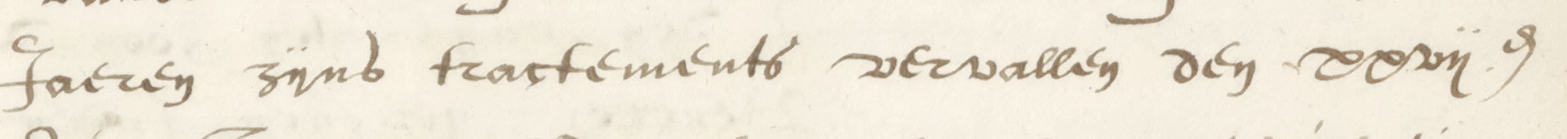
Jaeren zijns tractements vervallen den xxvijen
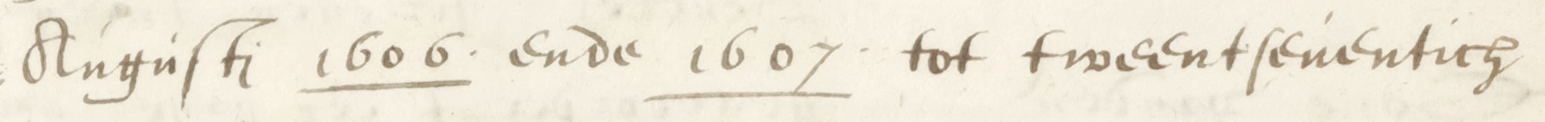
Augusti 1606. ende 1607. tot tweentseuentich
